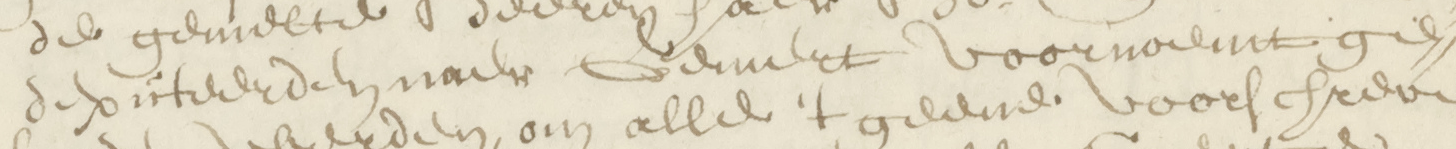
deputeerden naer Gemert voornoemt ge,,
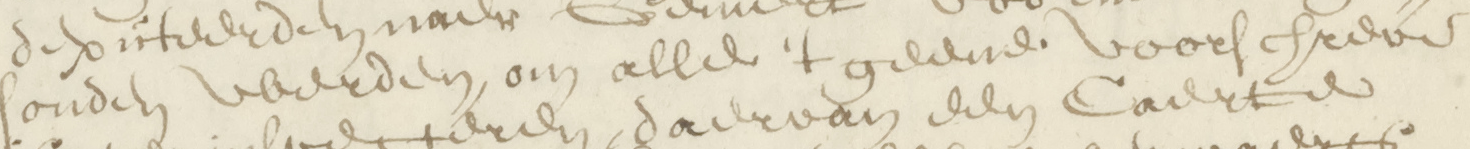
sonden werden, om alle 't geene voorschreve
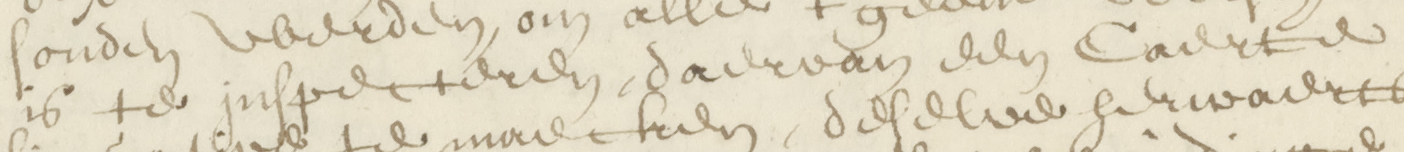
is te inspecteren, daervan een Caerte
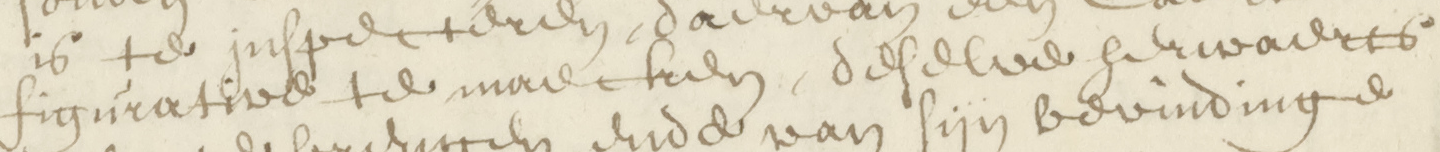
figurative te maecken, deselve herwaerts
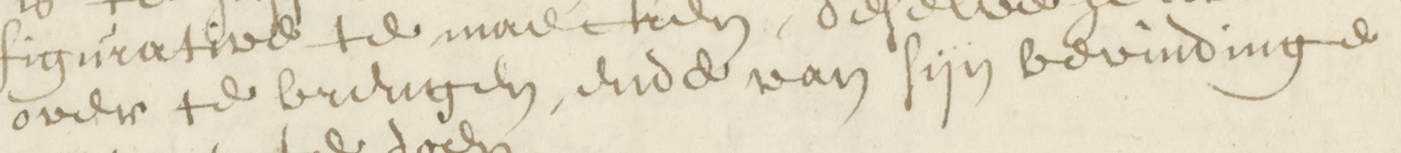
over te brengen, ende van sijn bevindinge
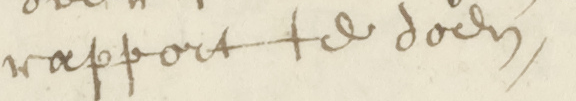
rapport te doen.
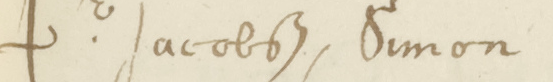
Pr. Jacobsz, Simon
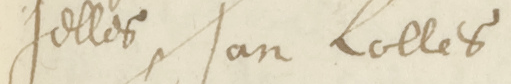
Jelles, Jan Lolles
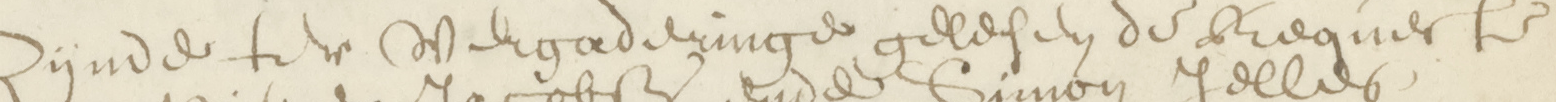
Sijnde ter Vergaderinge gelesen de Requeste
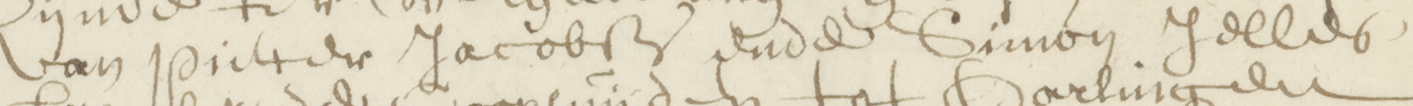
van Pieter Jacobsz ende Simon Jelles
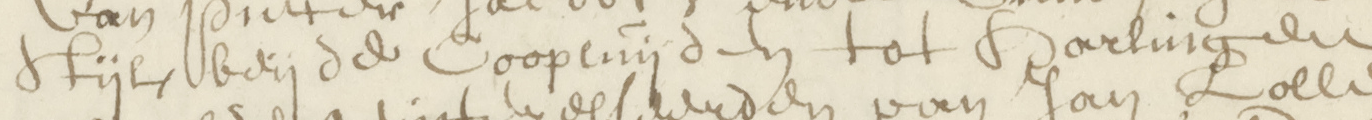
Stijl, beijde Coopluijden tot Harlingen
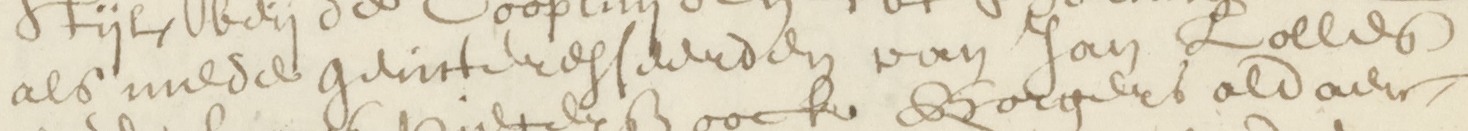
als mede geinteresseerden van Jan Lolles
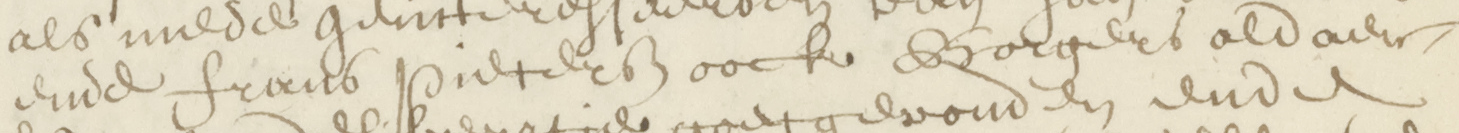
ende Frans Pieters oock Borgers aldaer.
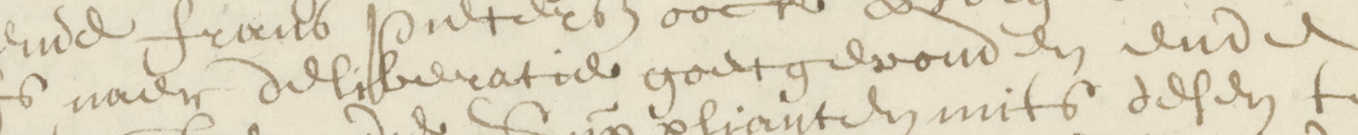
Is naer deliberatie goetgevonden ende
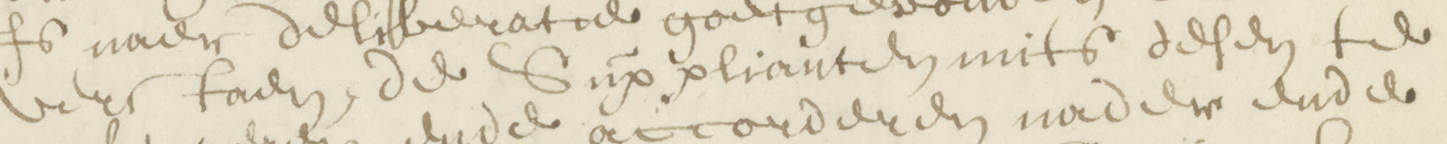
verstaen, de Supplianten mits desen te
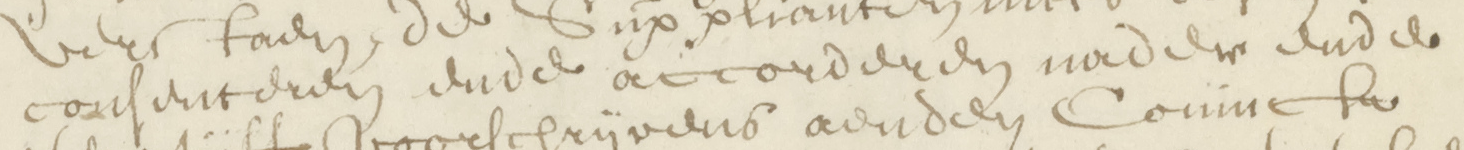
consenteren ende accorderen nader ende
